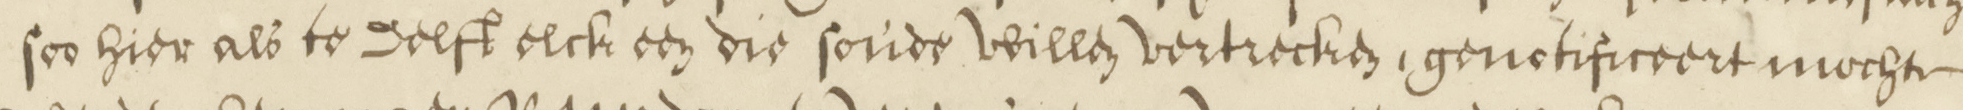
soo hier als te Delft elck een die soude willen vertrecken, genotificeert mochte
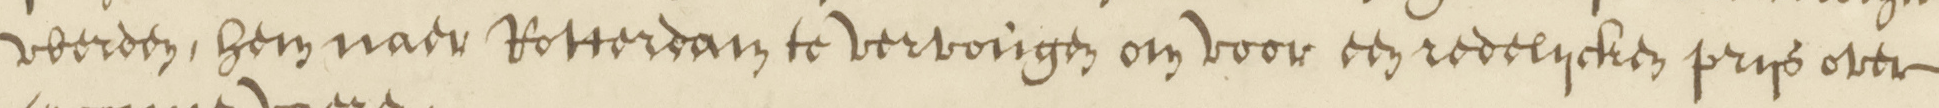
werden, hem naer Rotterdam te vervougen om voor een redelycken prys over
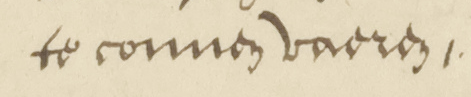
te connen vaeren.
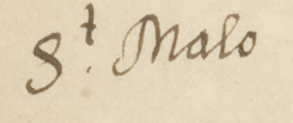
St. Malo
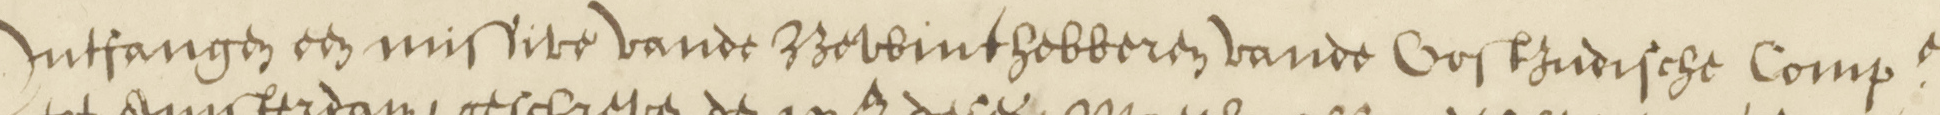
Ontfangen een missive vande Bewinthebberen vande OostIndische Compe
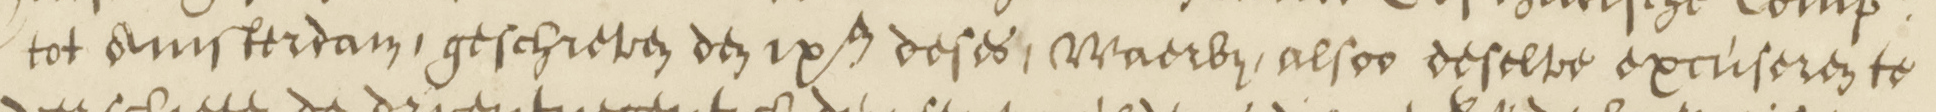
tot Amsterdam, geschreven den ixen. deses, Waerby, alsoo deselve excuseren te
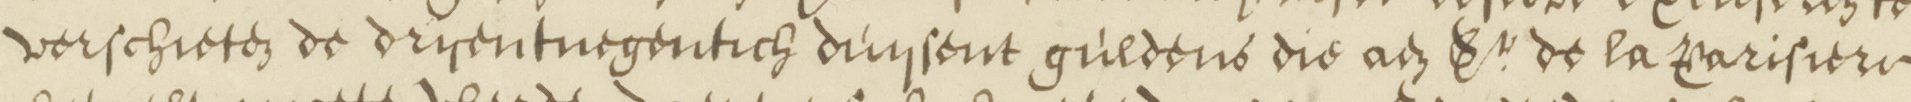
verschieten de dryentnegentich duysent guldens die aen Sr. de la Parisiere
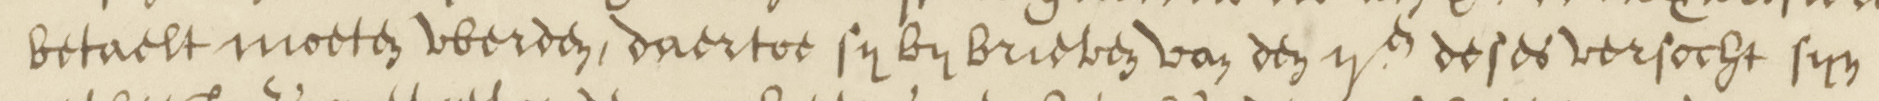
betaelt moeten werden, daertoe sy by brieven van den ijen. deses versocht syn
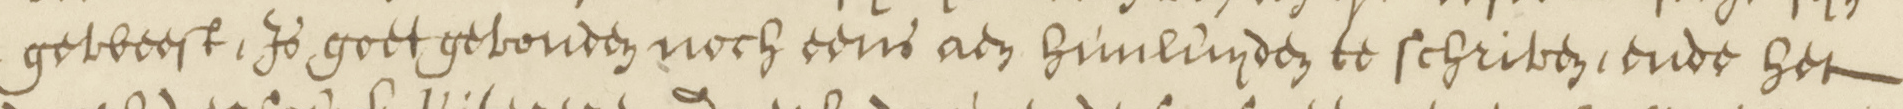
geweest. Is goet gevonden noch eens aen hunluyden te schriven, ende het
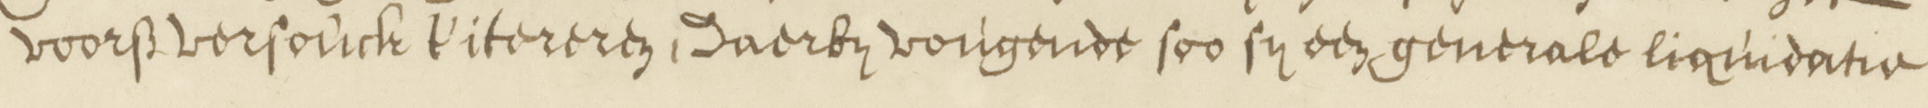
voors versouck t‛itereren, Daerby vougende soo sy een generale liquidatie
